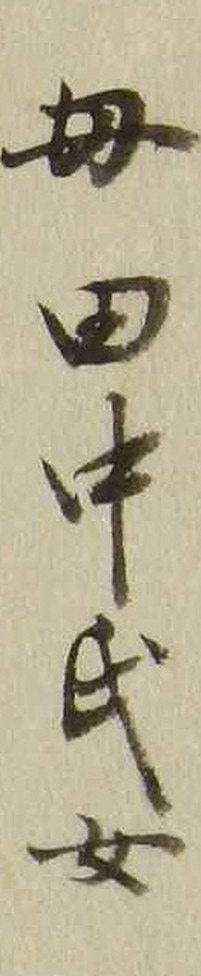母田中氏女
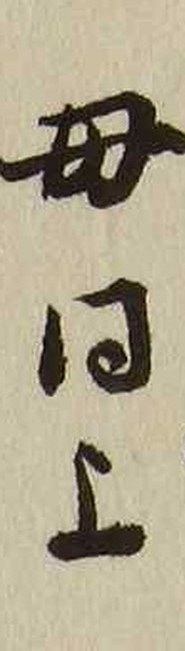母同上
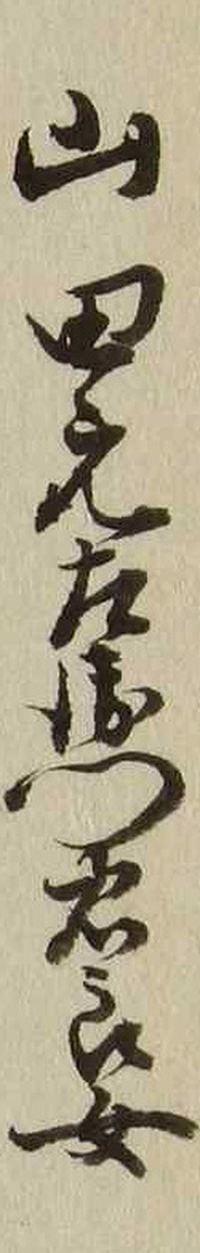山田元左衛門忠良女
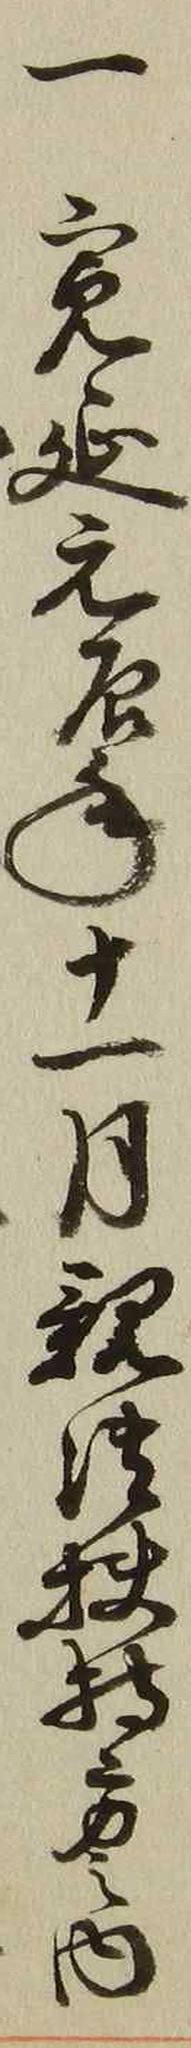一寛延元辰年十一月親御扶持方之内
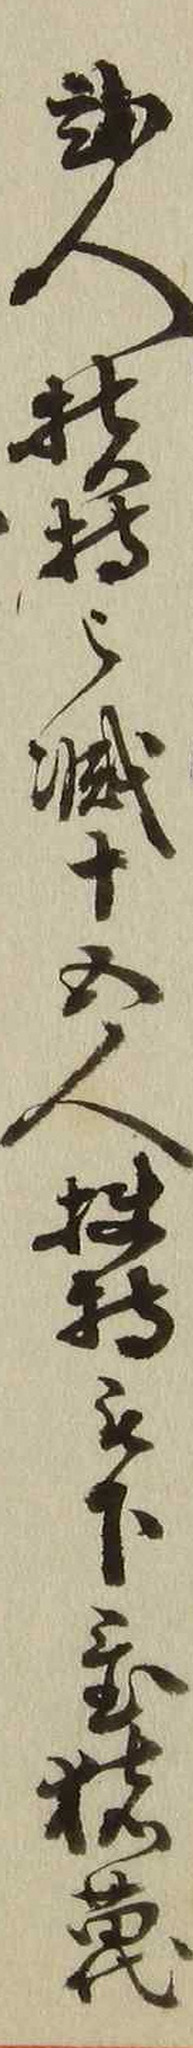弐人扶持被減十五人扶持被下置猪苗代
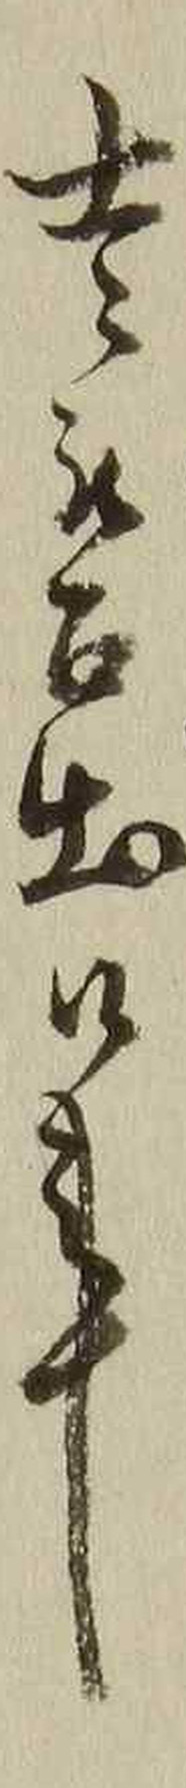士ニ被召出候事
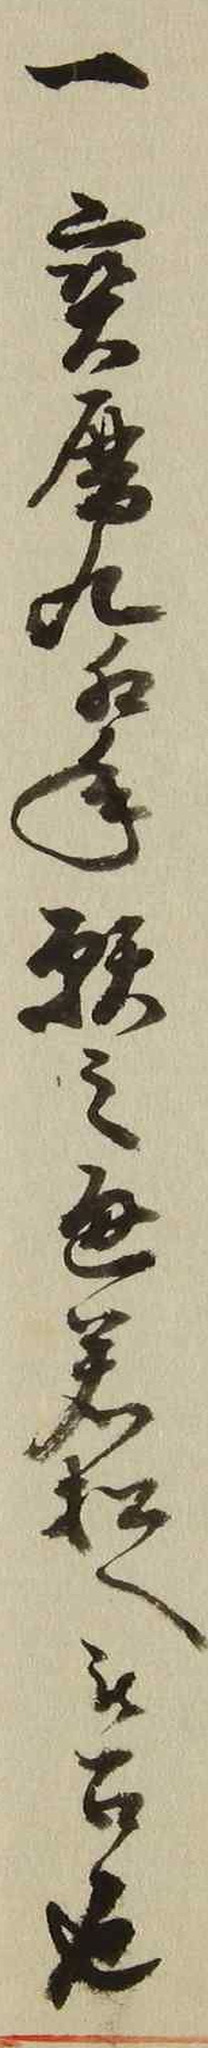一宝暦九卯年願之通若松へ被召返
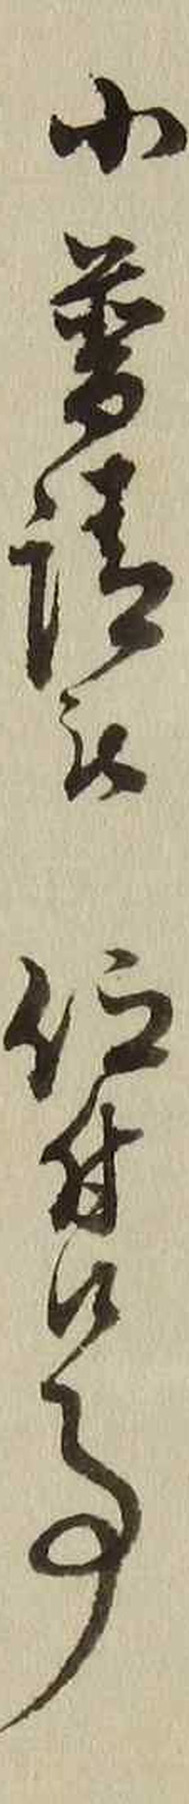小普請被仰付候事
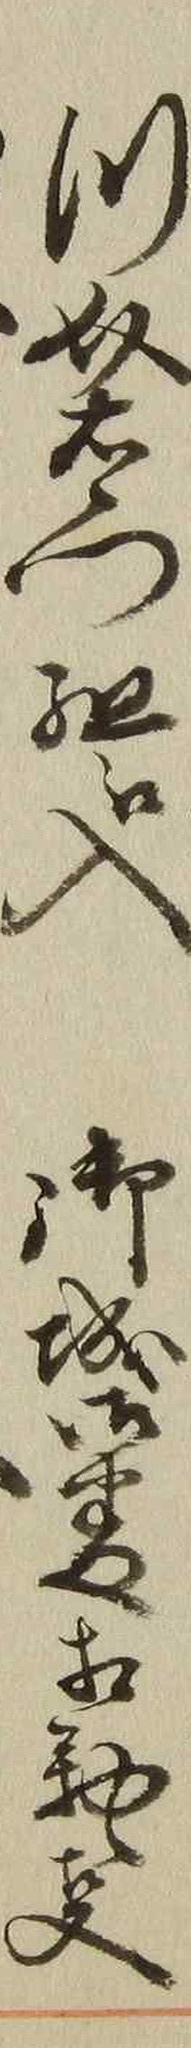川介右衛門組江入御城御番相勤候事
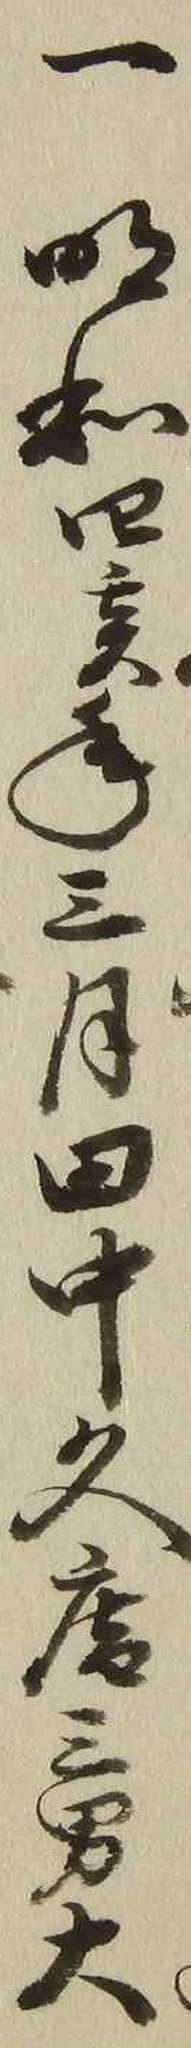一明和四亥三月田中久広三男大
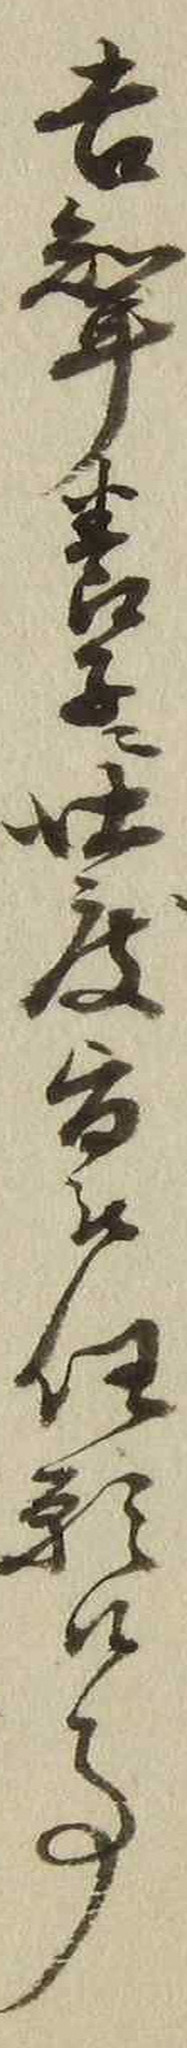吉聟養子ニ仕度旨被任願候事
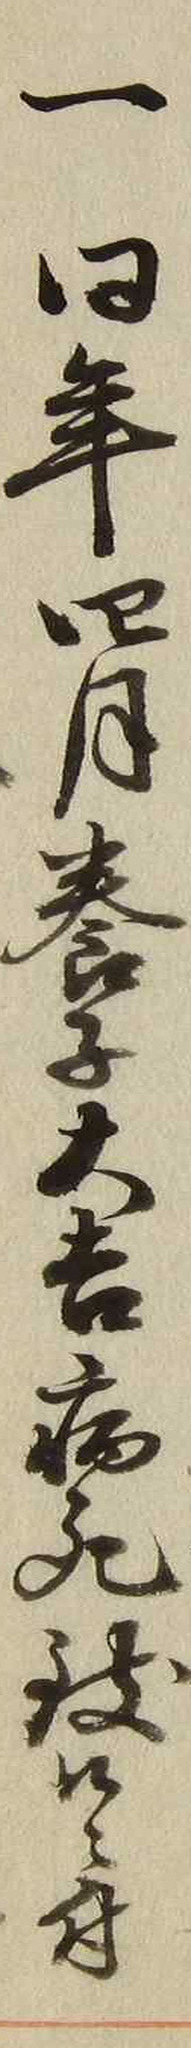一同年四月養子大吉病死致候ニ付
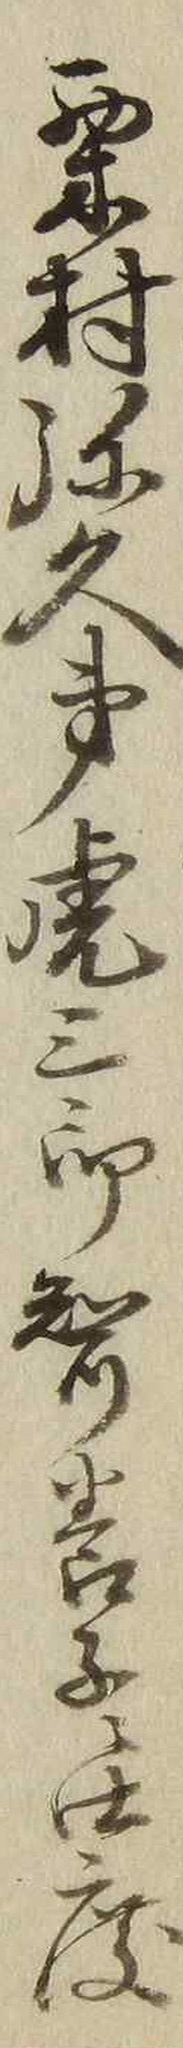栗村弥久弟虎三郎聟養子ニ仕度
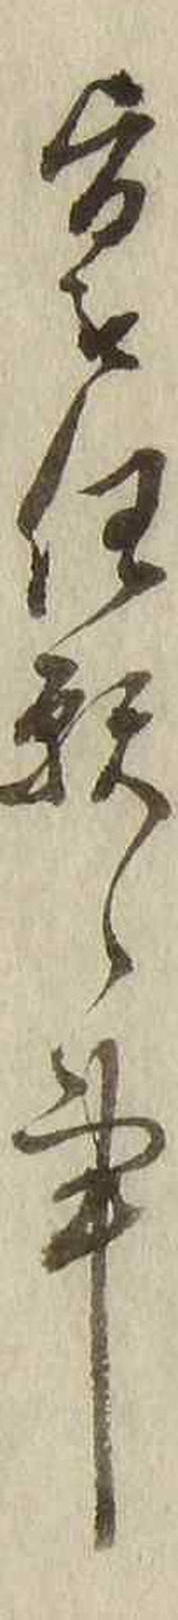旨被任願候事
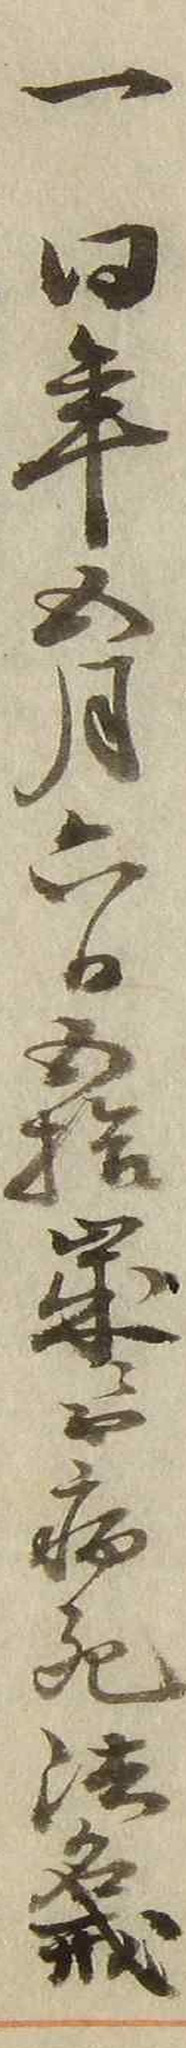一同年五月六日五拾歳ニ而病死法名戒
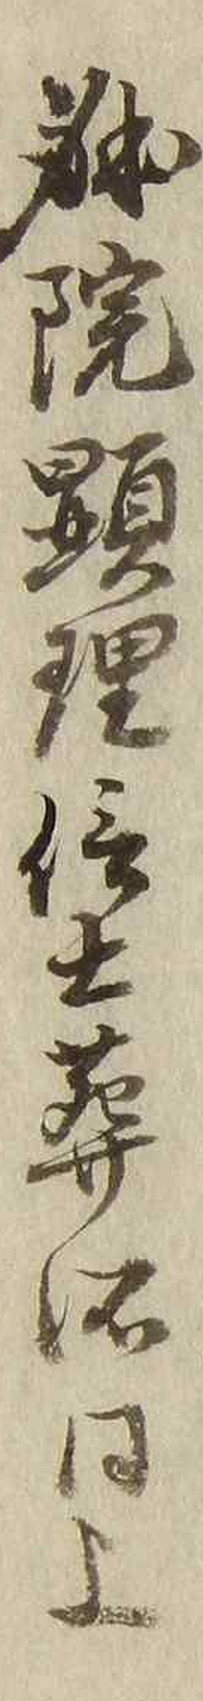躰院顕理信士葬所同上
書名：諸士系譜　巻之31　い之部31
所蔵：会津若松市立会津図書館
